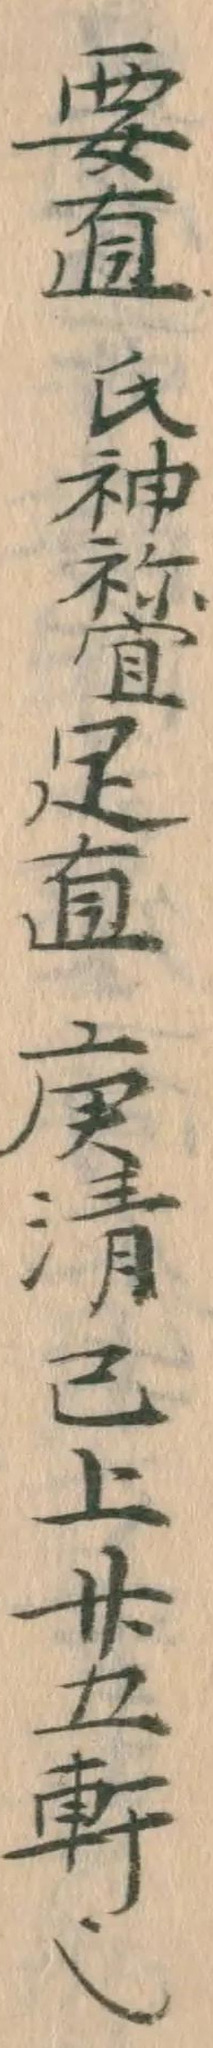要直氏神祢宜足直庚清已上廿五軒也
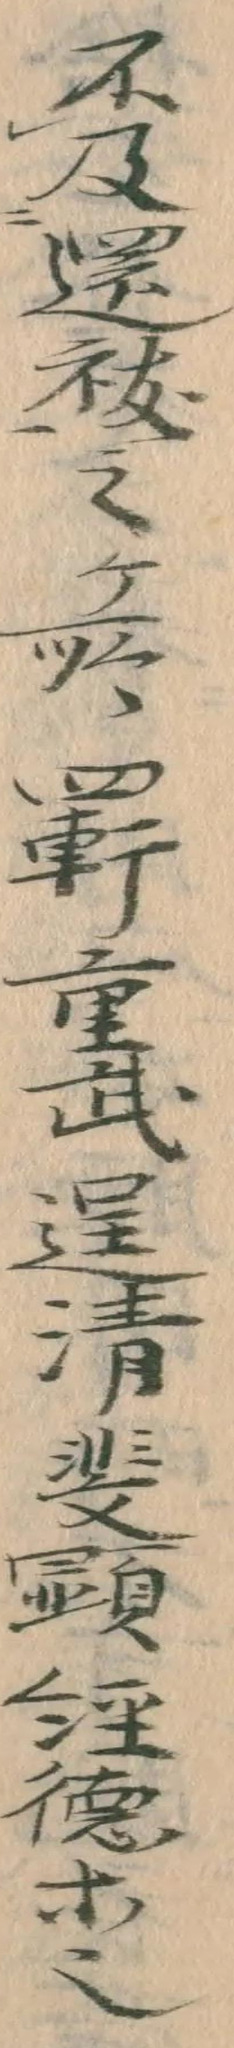不及還祓之ヶ所四軒重武逞清斐顕経徳等也
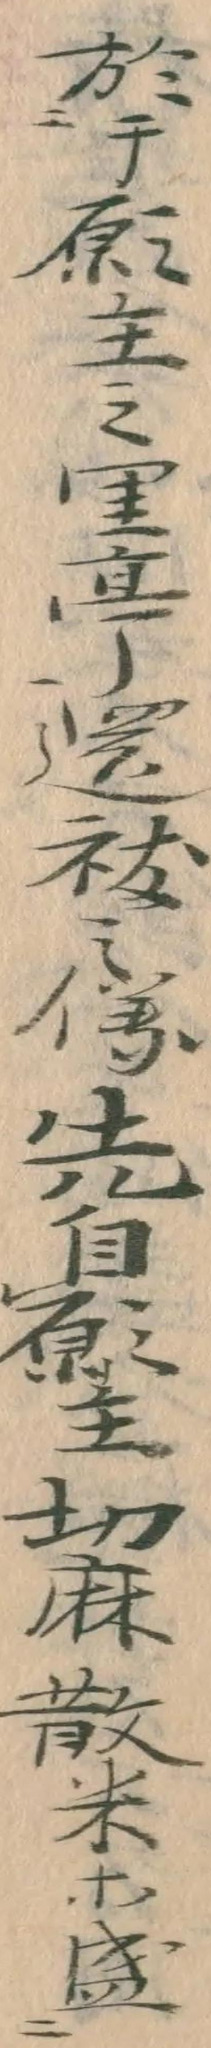於于願主之里亭還祓之儀先自願主切麻散米等盛
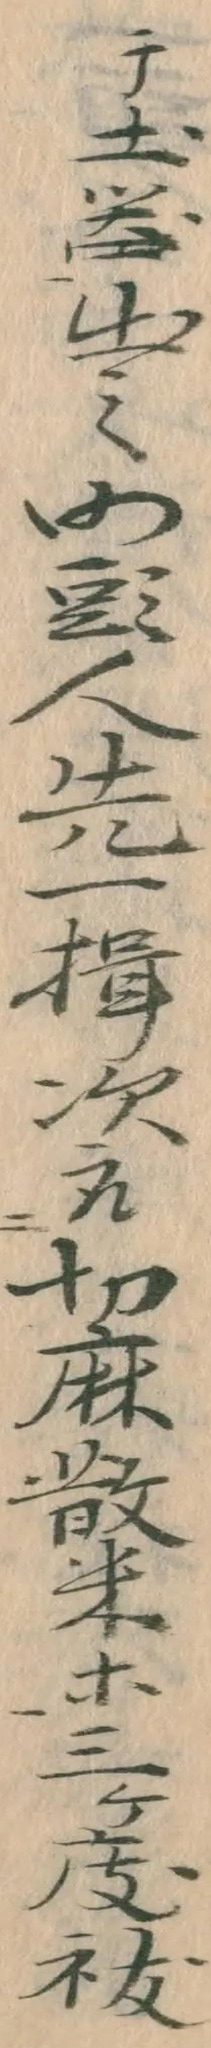于土器出之仍頭人先一揖次取切麻散米等三ケ度祓
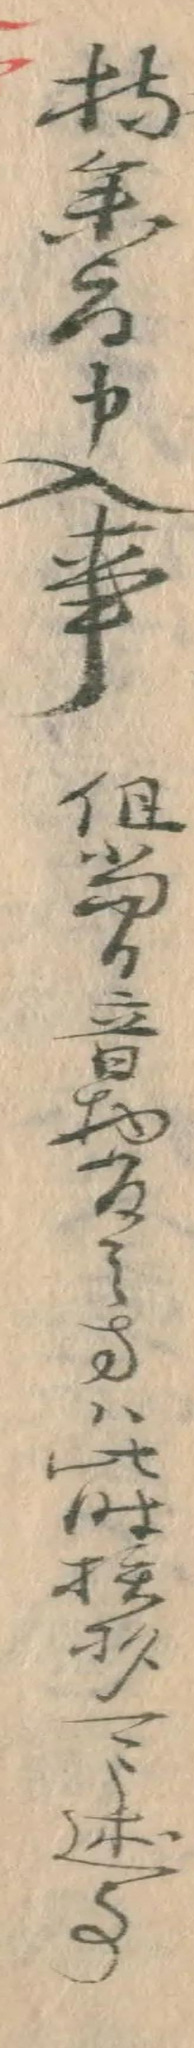持参旨申入事但當日音物有之方ハ此時挨拶可被述事
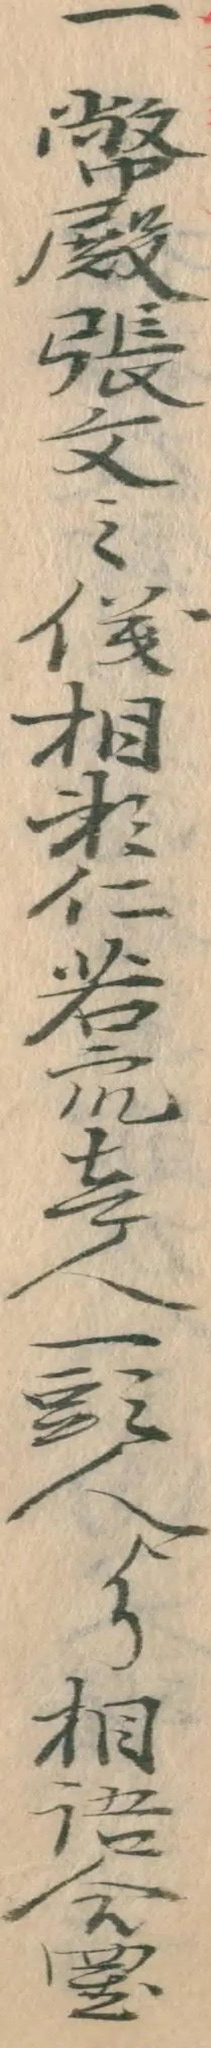一幣殿張文之儀相頼仁若衆壱人一頭人より相詰合置
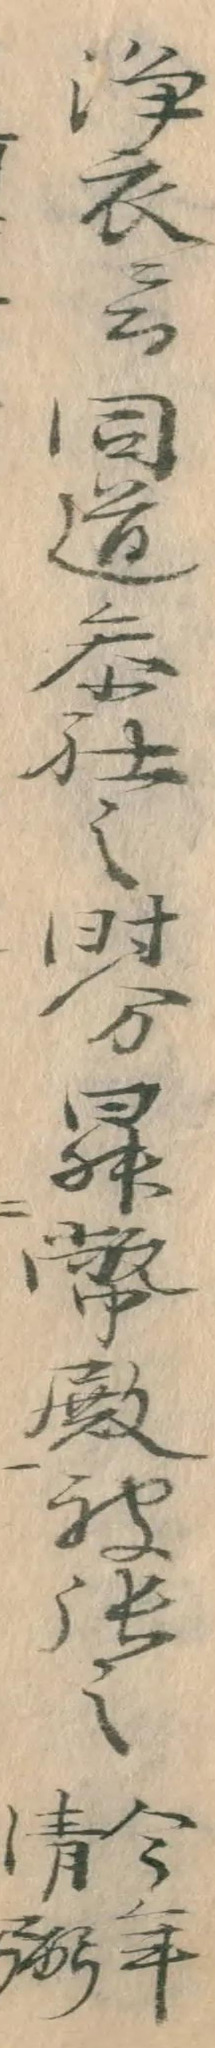浄衣ニ而同道参社之時分昇幣殿被張之今年清弼

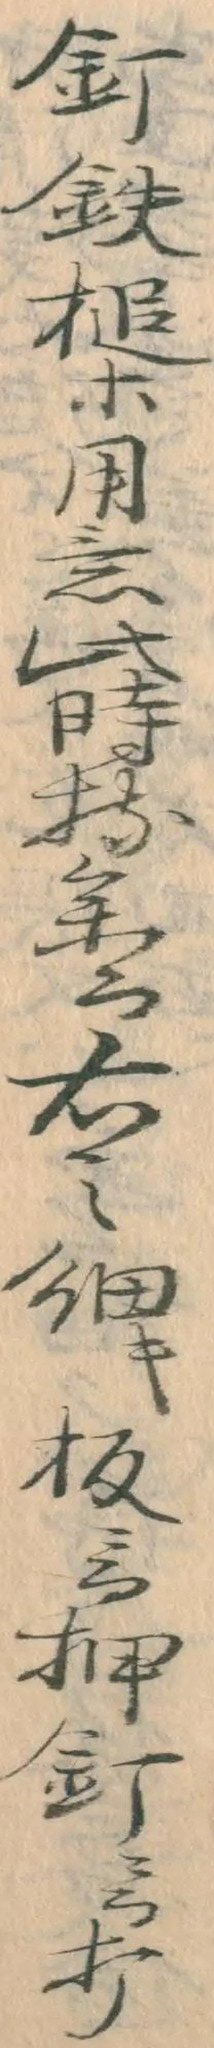釘鉄槌等用意此時持参而右之細き板ニ而押釘ニ而打
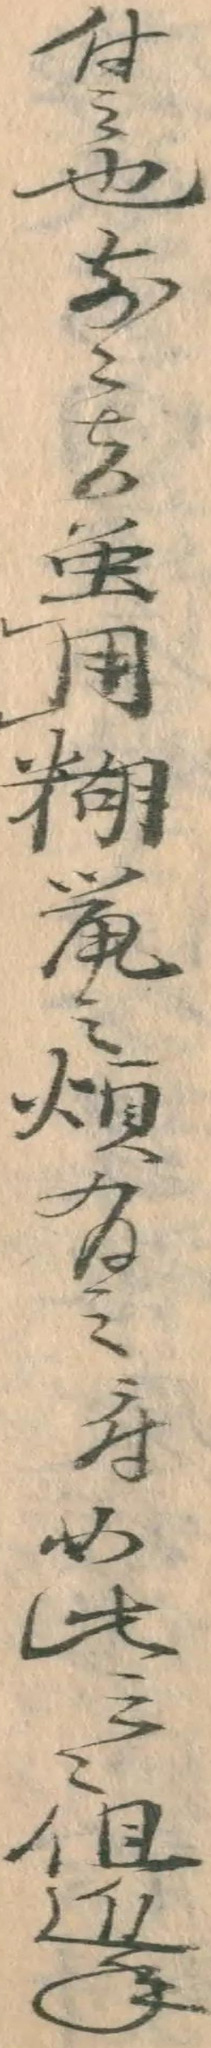付之也前々は用糊巤煩有之ニ付如此云〻但近年
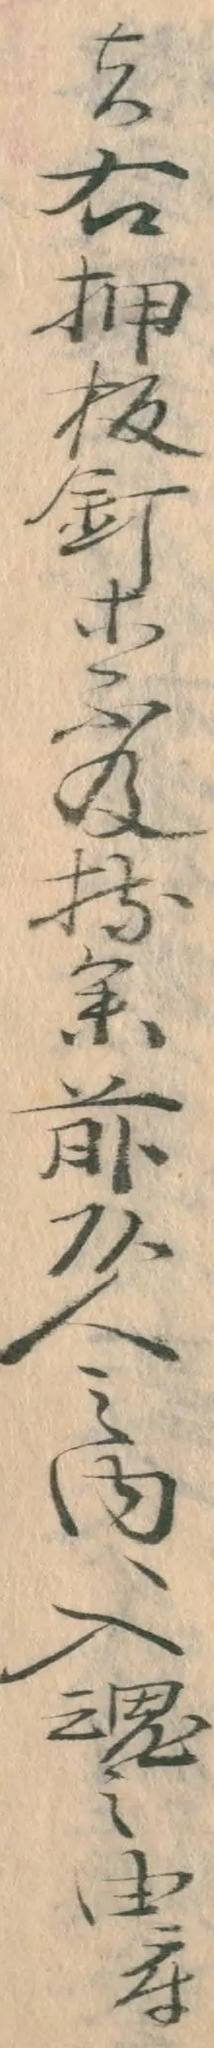者右押板釘等不及持参前頭人之内へ入魂之由ニ付
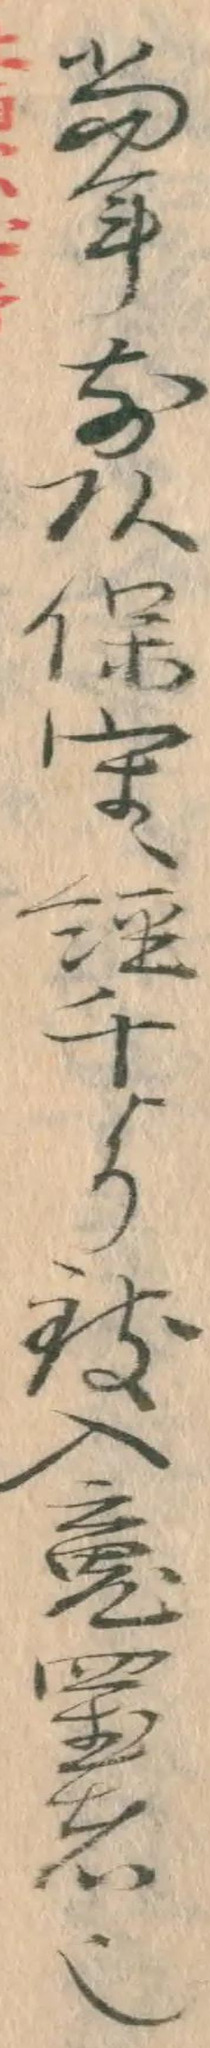當年前頭保守へ経千より致入魂置者也
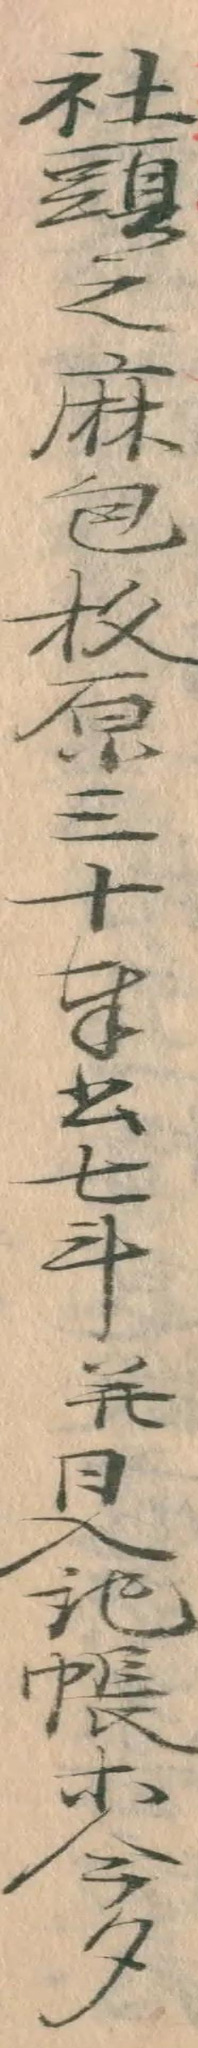一社頭之麻包枚原三十奉書七斗并日入記帳等今夕
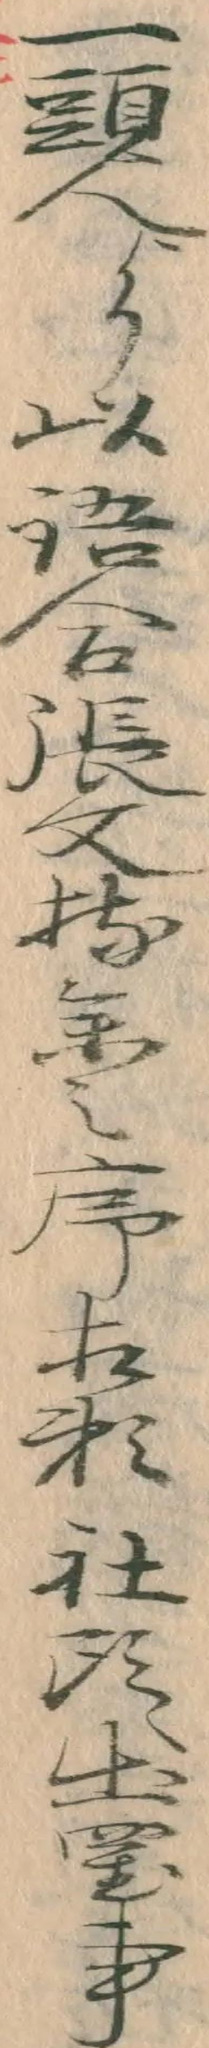一頭人より以語合張文持参之序相頼社頭へ出置事
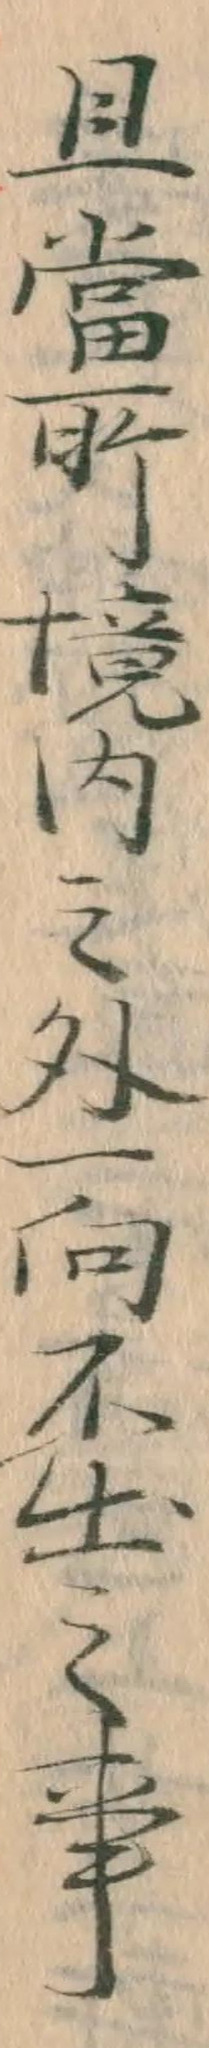且當所境内之外一向不出之事
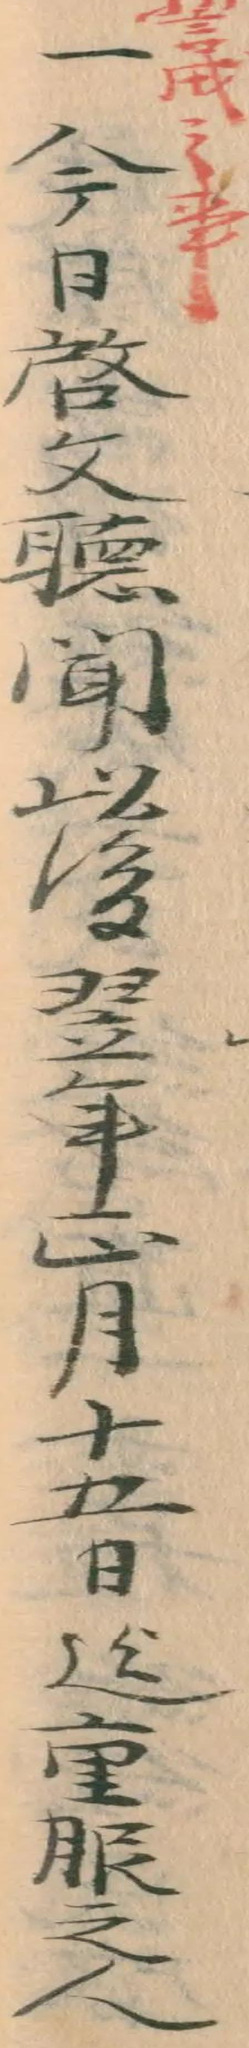一今日啓文聴聞以後翌年正月十五日迄重服之人
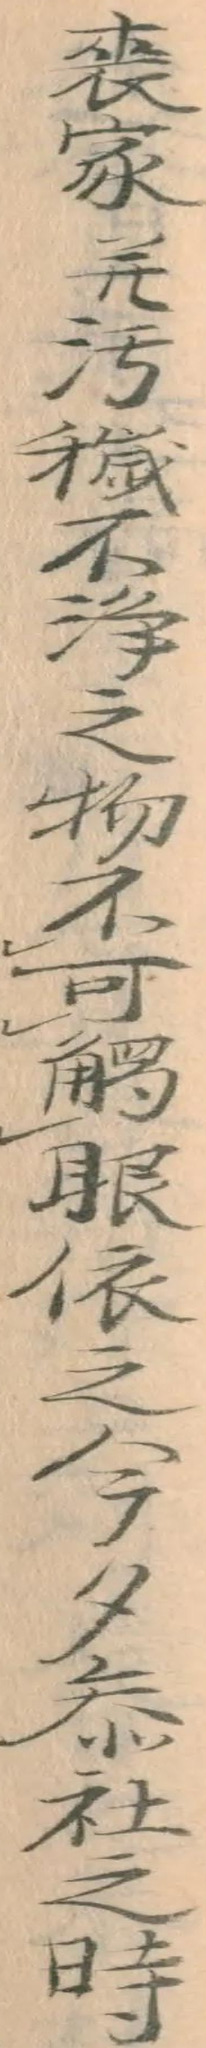喪家并汚穢不浄之物不可触眼依之今夕参社之時
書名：賀茂社記録. 第72冊
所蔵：国立国会図書館 National Diet Library, JAPAN
